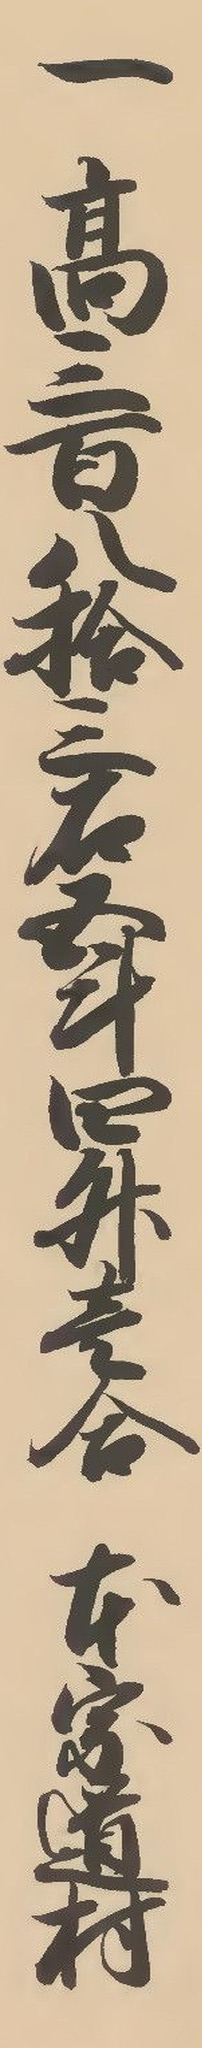一高三百八拾三石五斗四升壱合本宗道村
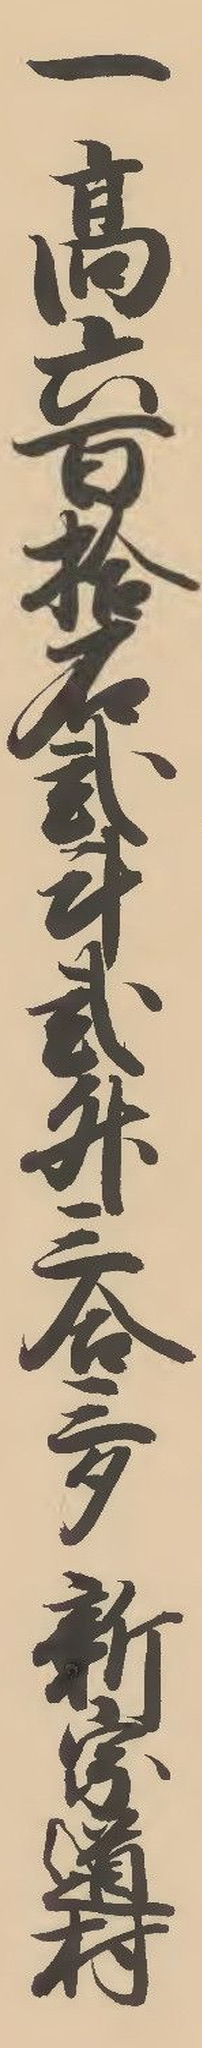一高六百拾石弐斗弐升三合三勺新宗道村
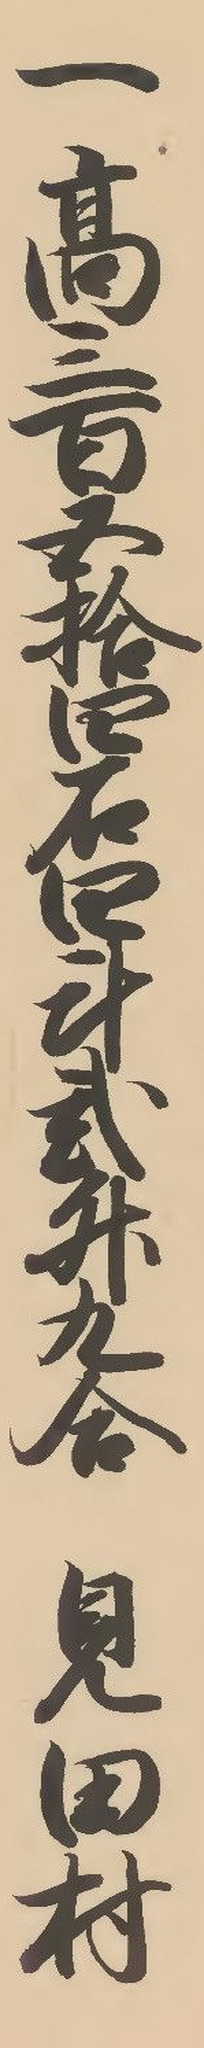一高三百五拾四石四斗弐升九合見田村
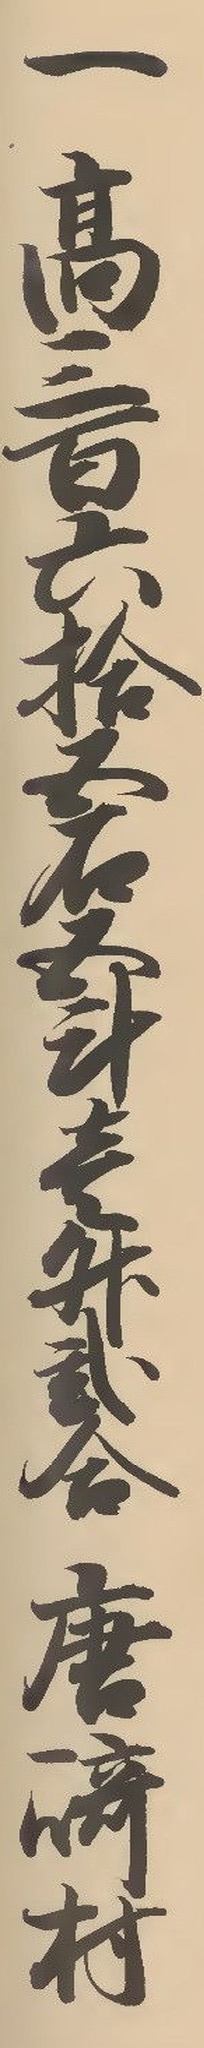一高三百六拾五石五斗壱升弐合唐崎村
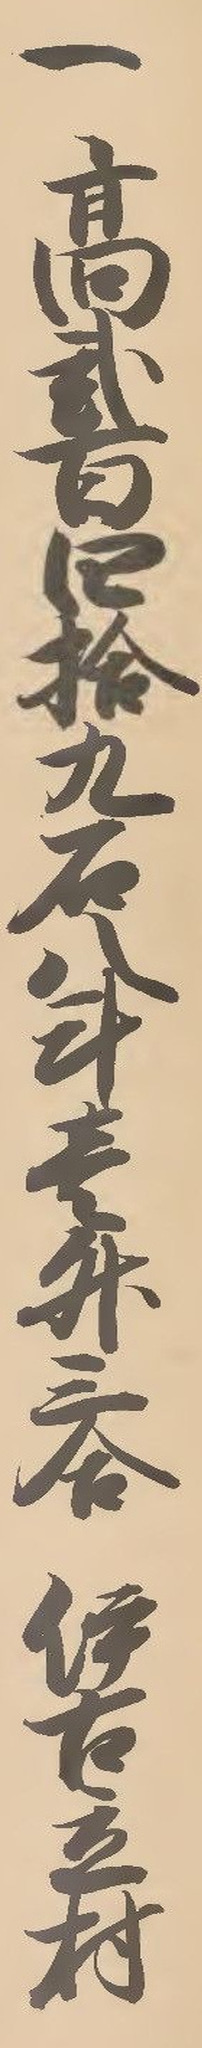一高弐百四拾九石八斗壱升三合伊古立村
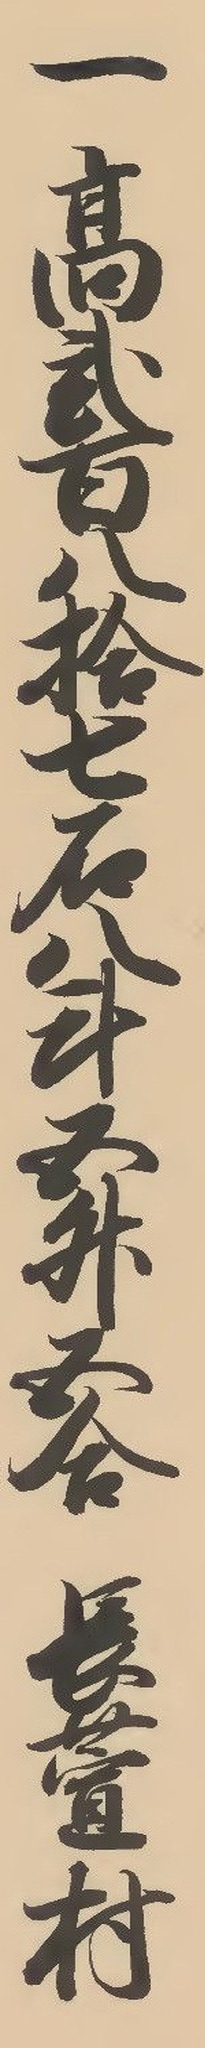一高弐百八拾七石八斗五升五合長萱村
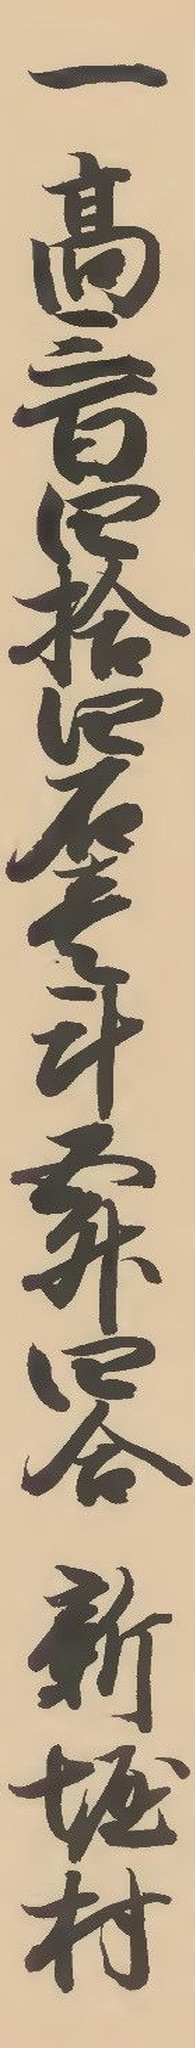一高三百四拾四石壱斗五升四合新堀村
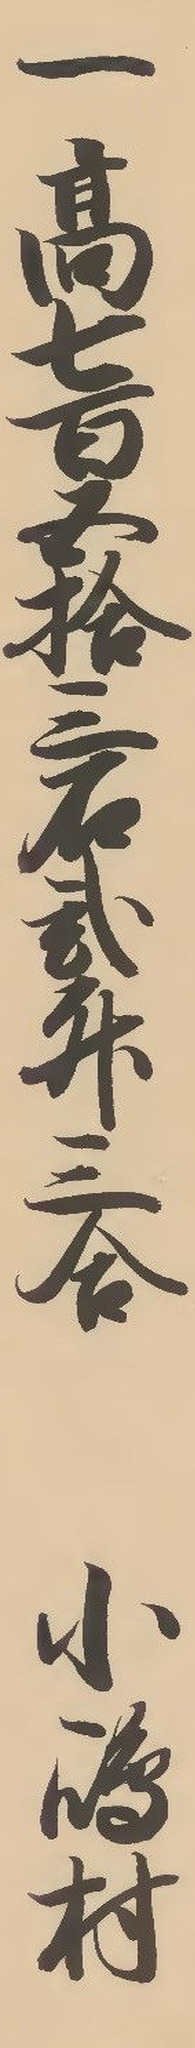一高七百五拾三石弐升三合小島村

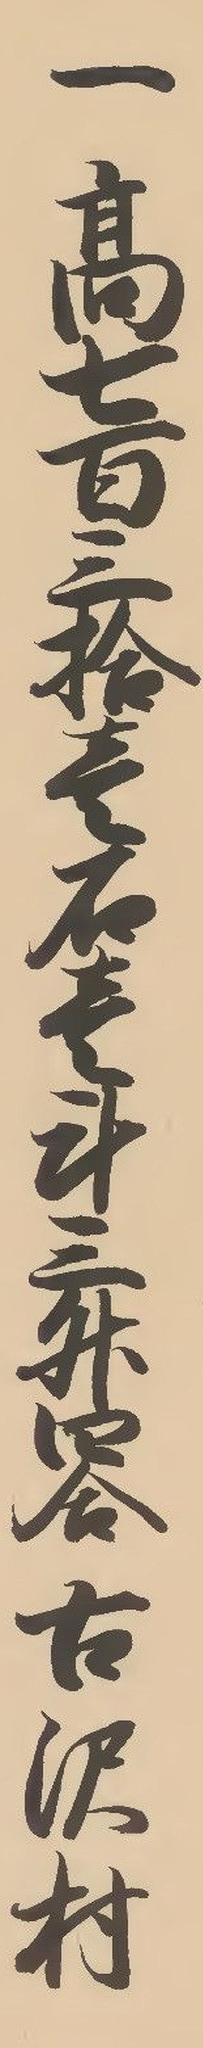一高七百三拾壱石壱斗三升四合古沢村
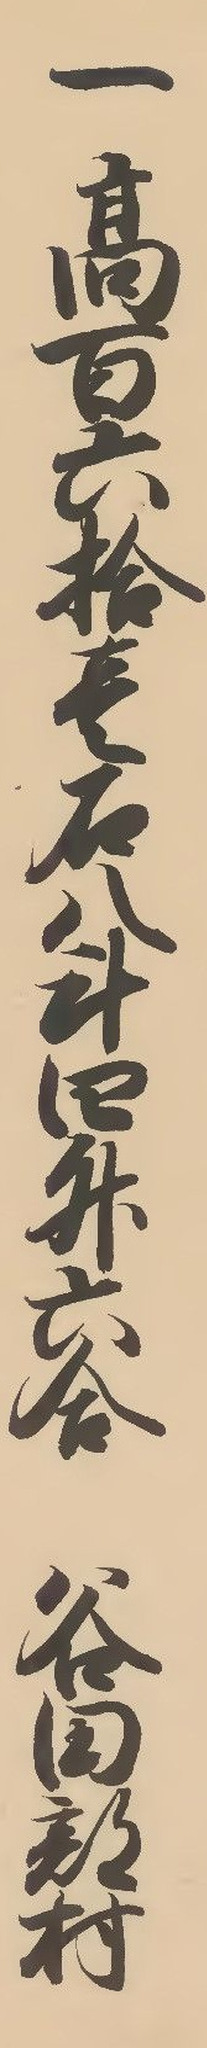一高百六拾壱石八斗四升六合谷田部村
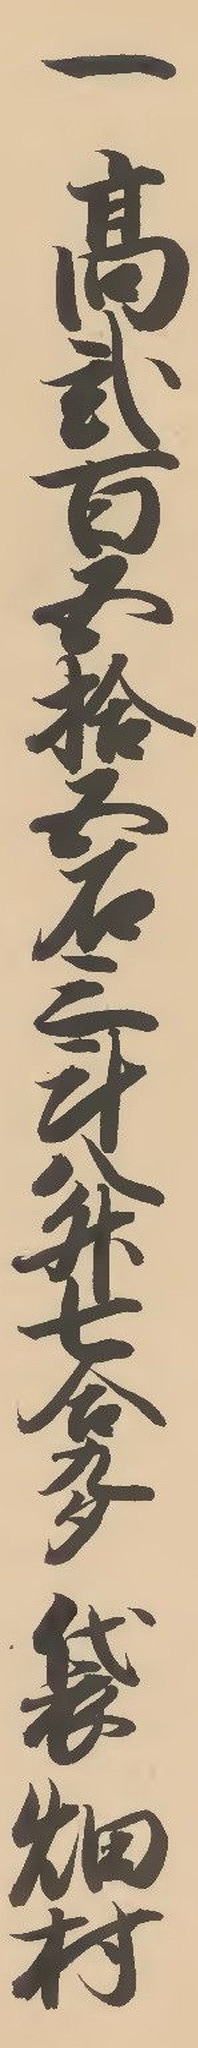一高弐百五拾五石三斗八升七合九勺袋畑村
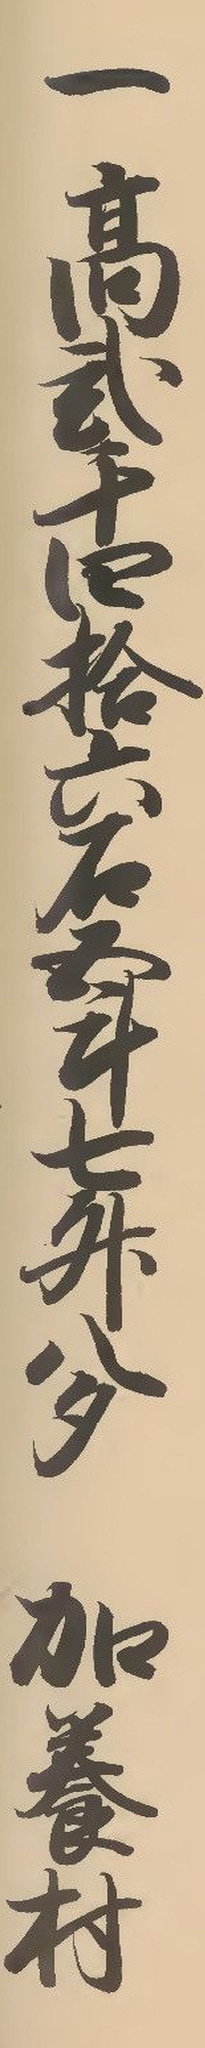一高弐千四拾六石五斗七升八勺加養村
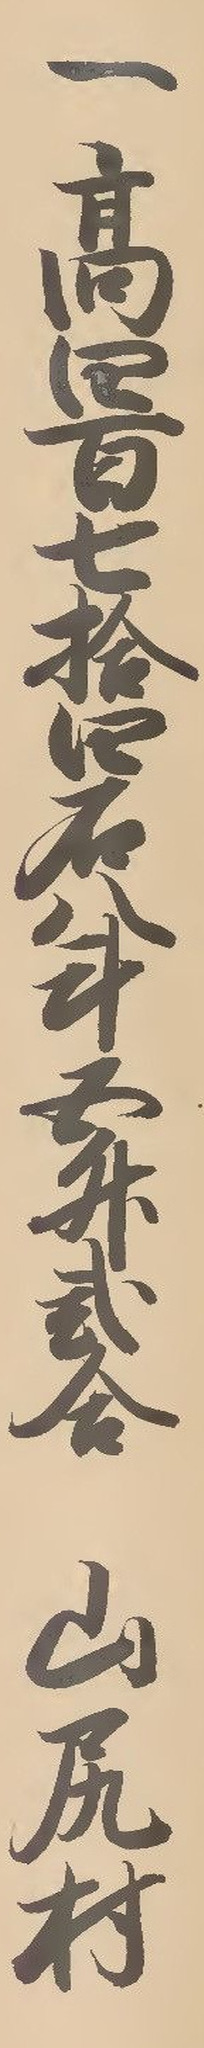一高四百七拾四石八斗五升弐合山尻村
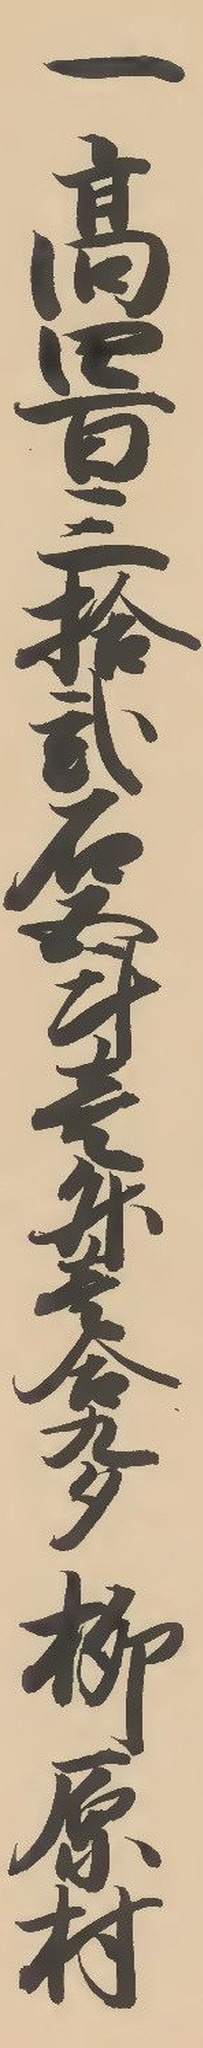一高四百三拾弐石五斗壱升壱合九勺柳原村
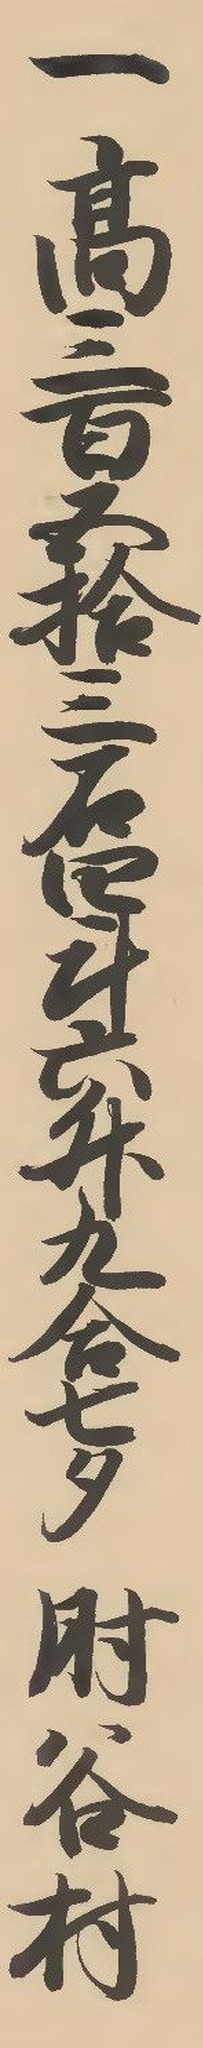一高三百五拾三石四斗六升九合七勺肘谷村

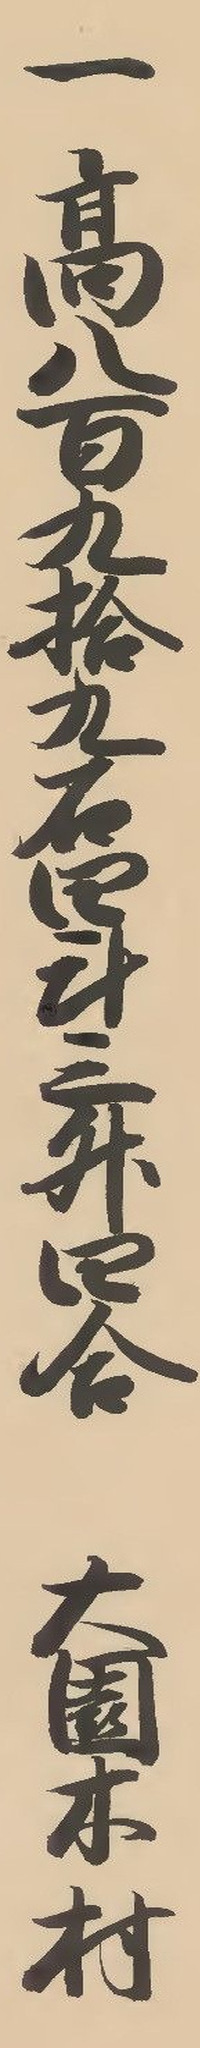一高八百九拾九石四斗三升四合大園木村
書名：下総国郷帳
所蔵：国立公文書館 National Archives of Japan
